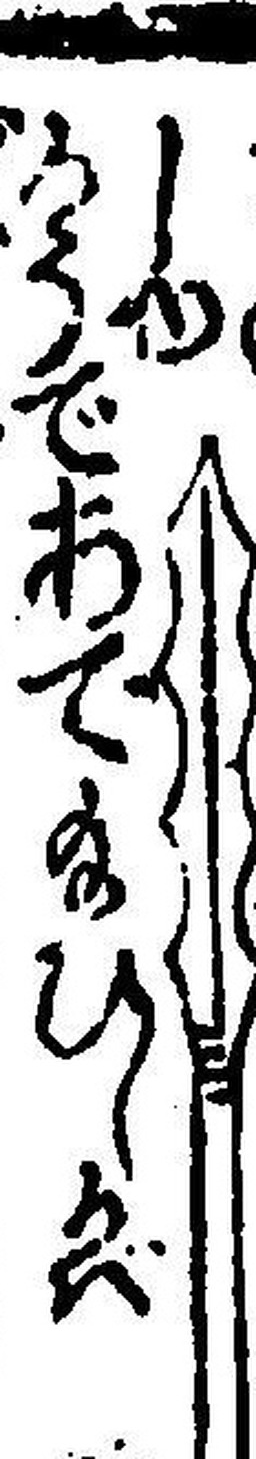かうであて給ひしかば
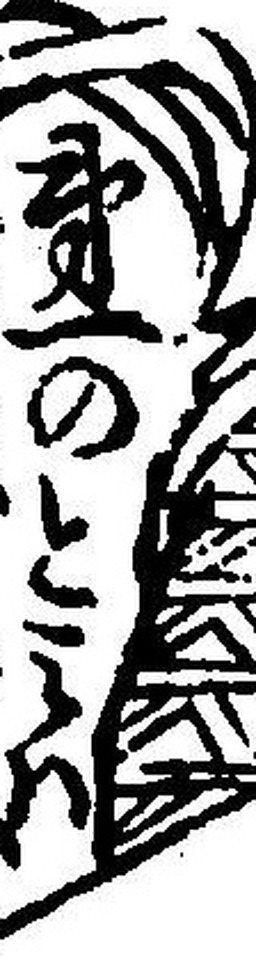第一のとみは
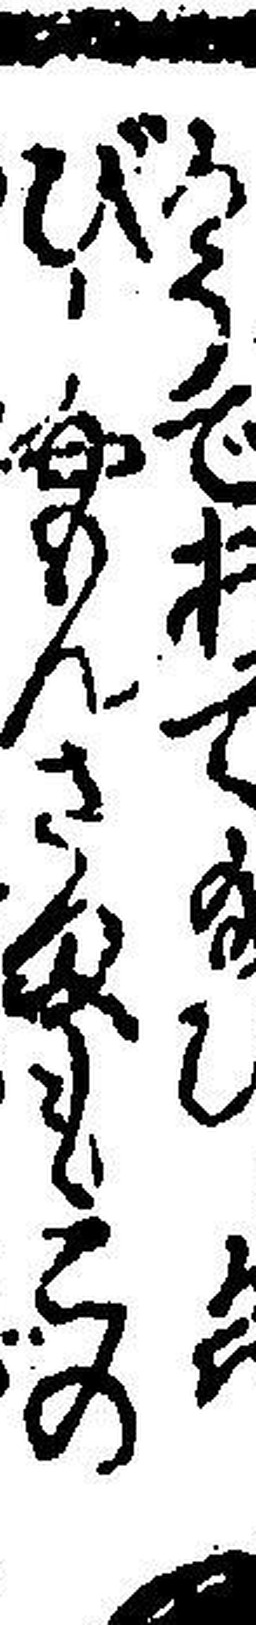びしやもんさまもこの
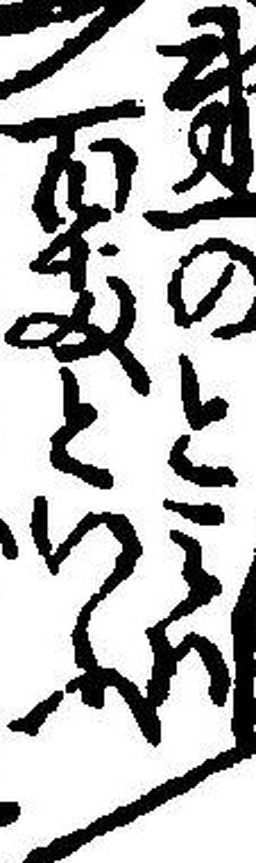百両といふ
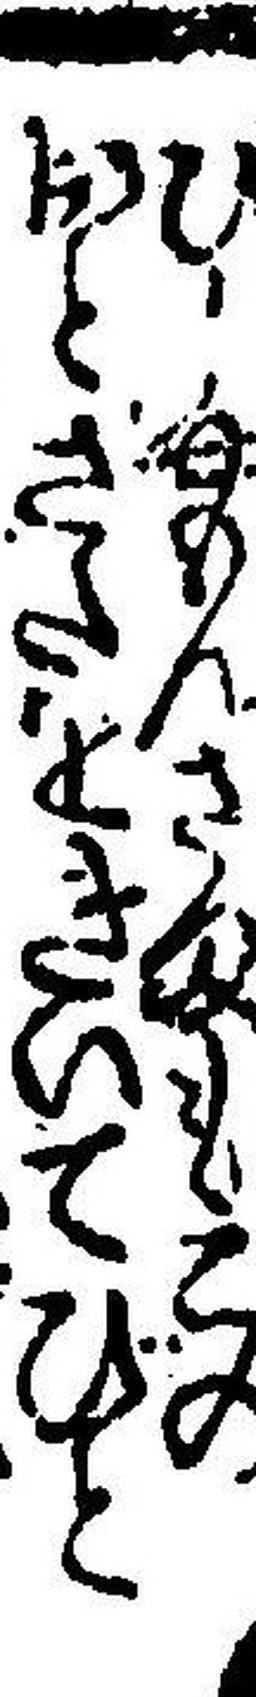おとさたをきいてひと
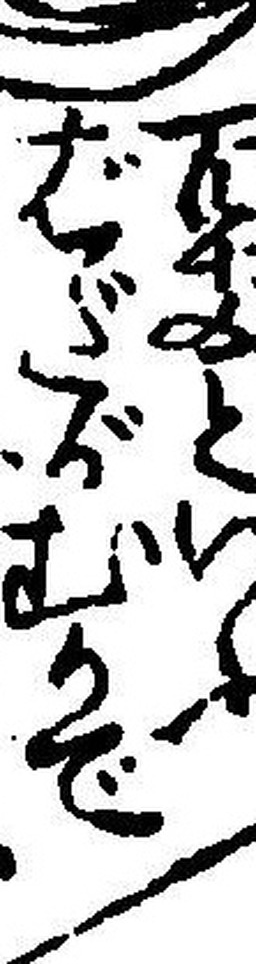ばだがむかで
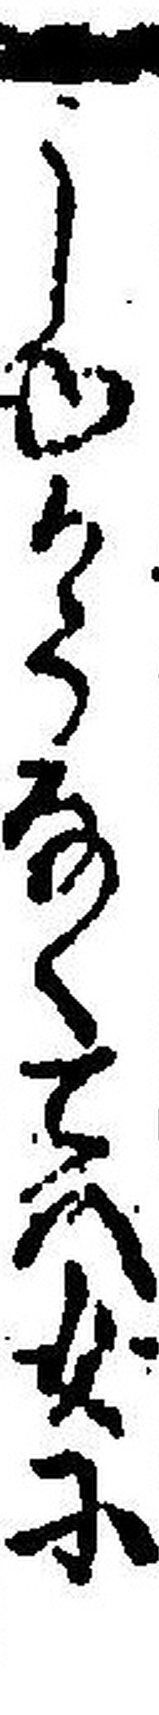しゆかうなくては女に
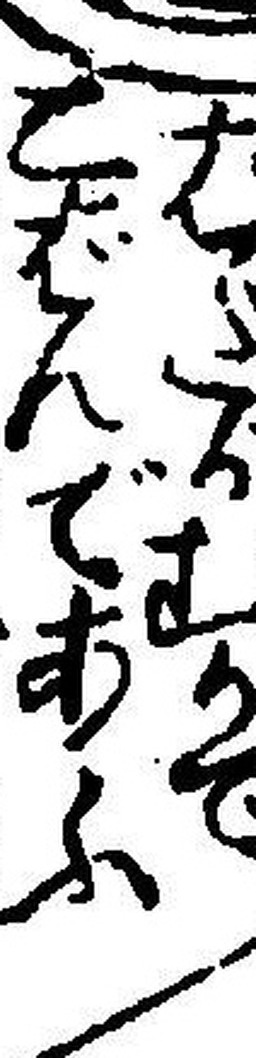こばんであらふ
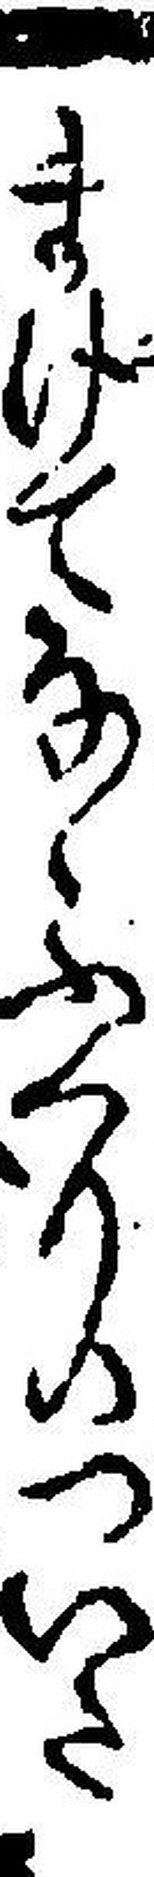まけてなゝふくりのついた
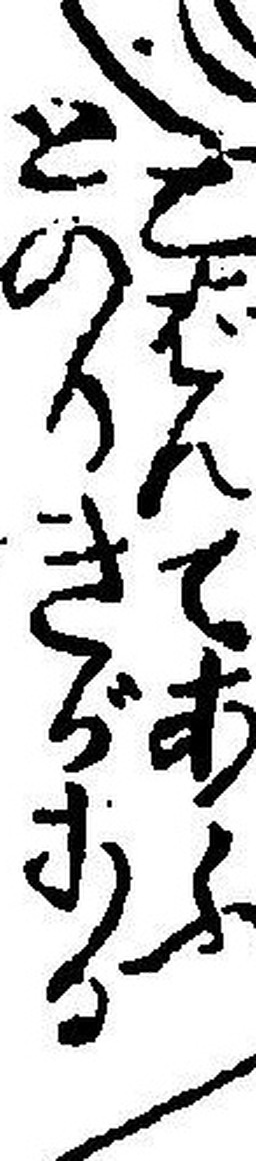とのりきがある
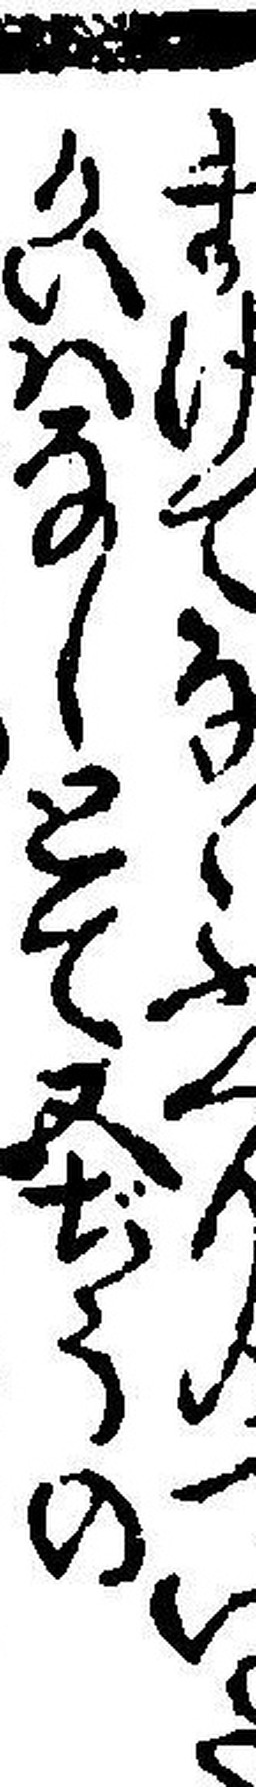かいはなしとて五ぢうの
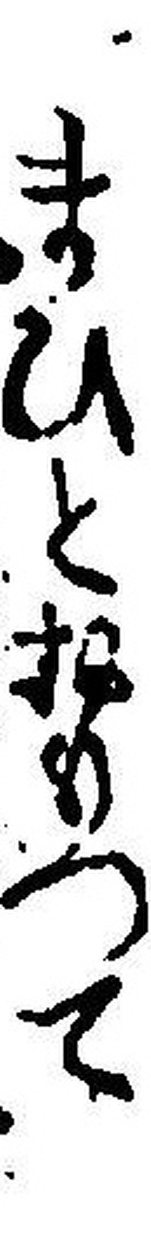まひとおもつて
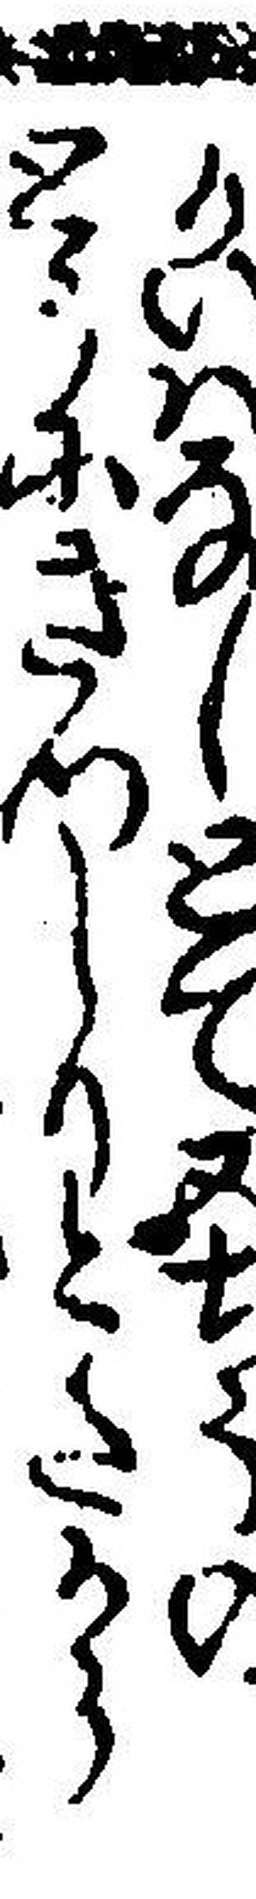とうにきつしりとたから
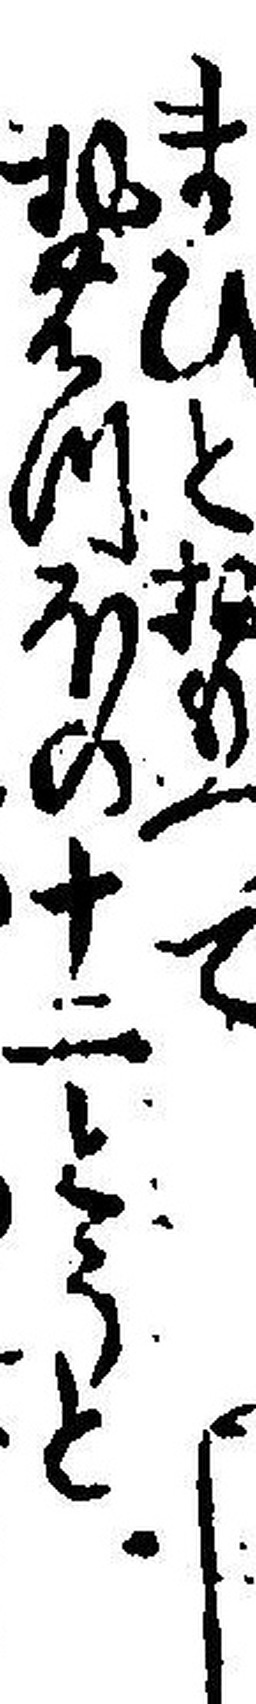おはつほの十二とうと
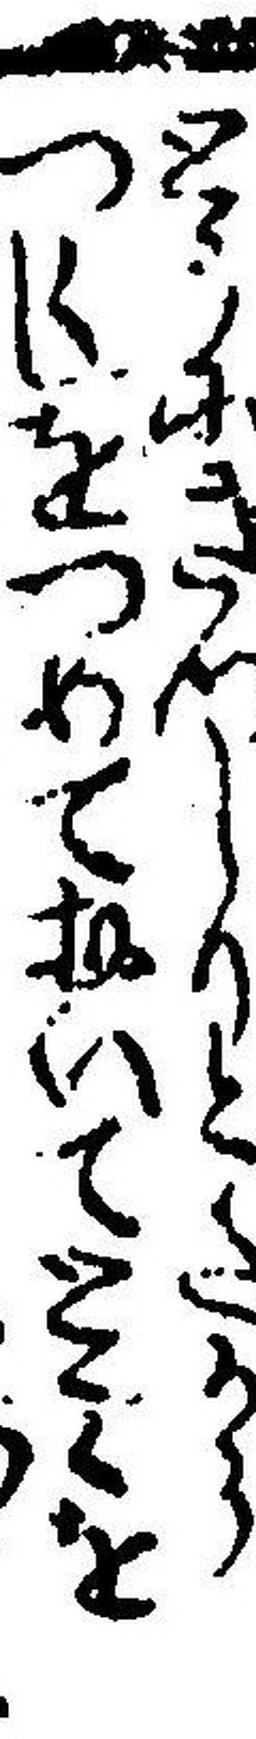つくしをつめておいてとみを
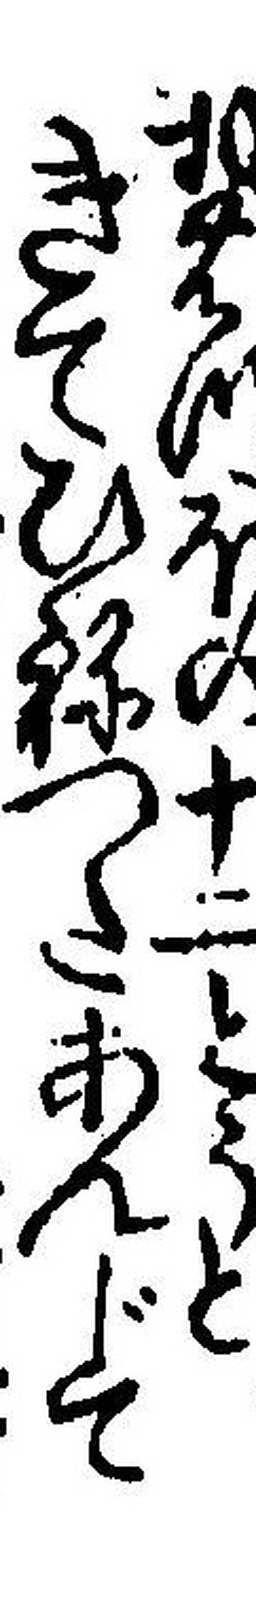きてひねつたあんじて
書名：徳若水縁起金性 / 樹下石上作
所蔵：東京大学総合図書館 General Library in the University of Tokyo, JAPAN
